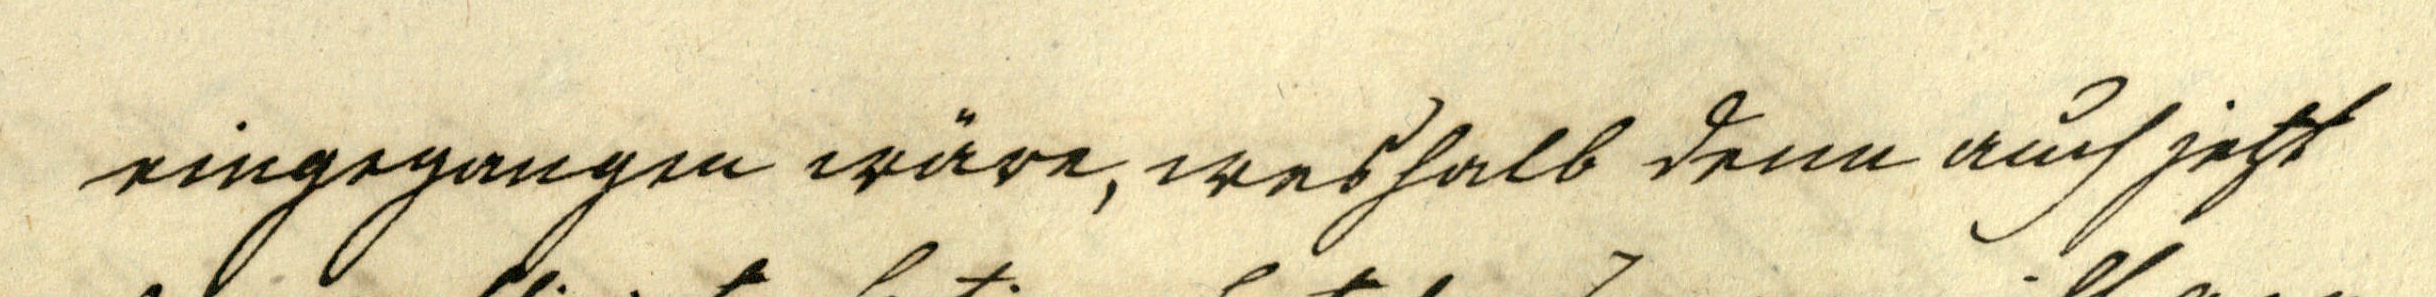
eingegangen wäre, weshalb denn auch jetzt
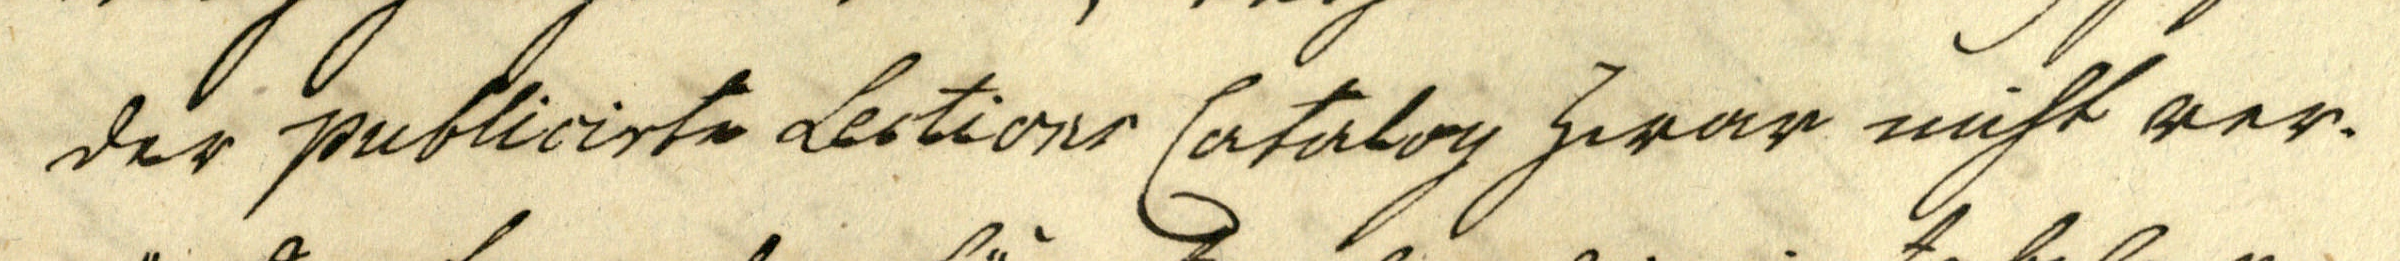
der publicirte Lections Catalog zwar nicht ver¬
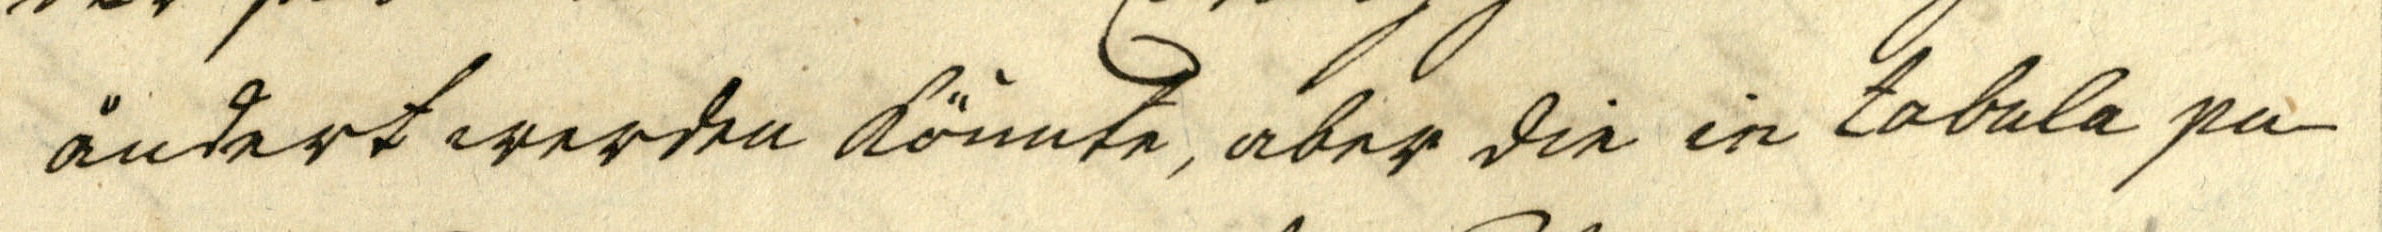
ändert werden könnte, aber die in tabula pu¬
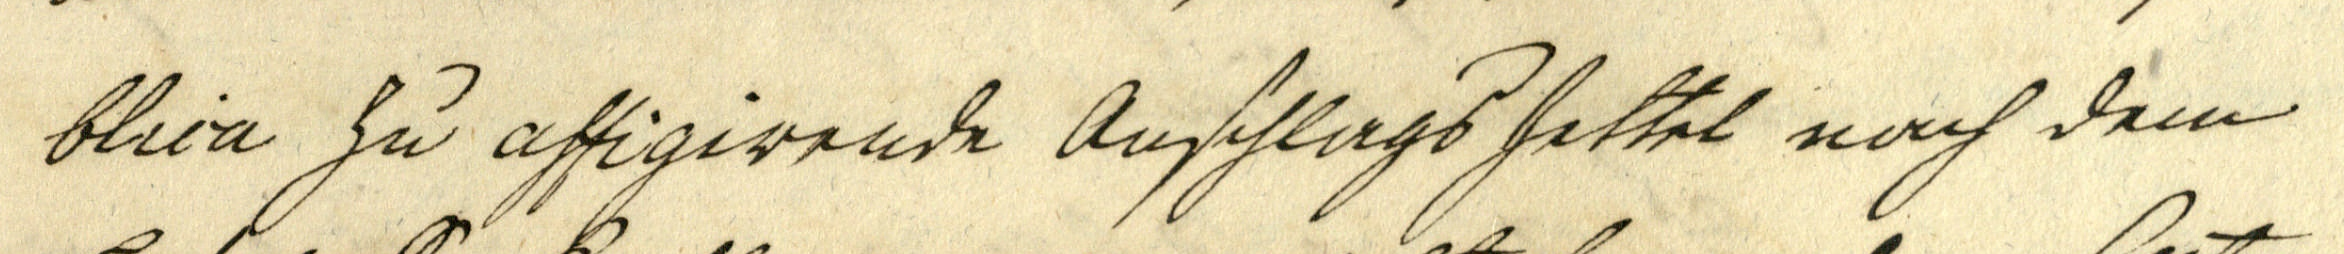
blica zu affigirende Anschlags Zettel nach dem
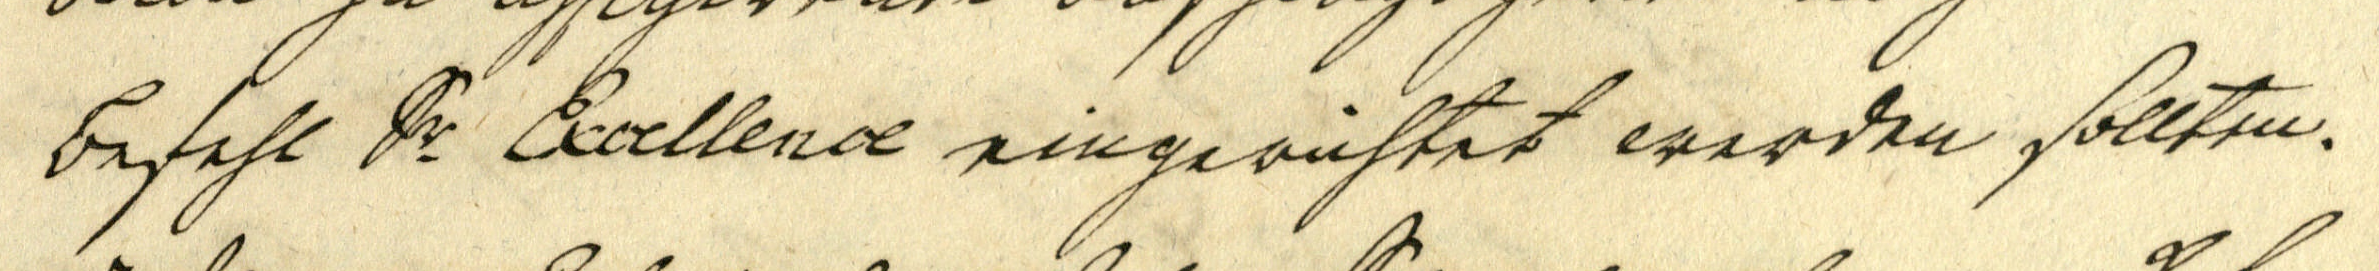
Befehl Sr Excellence eingerichtet werden sollten.
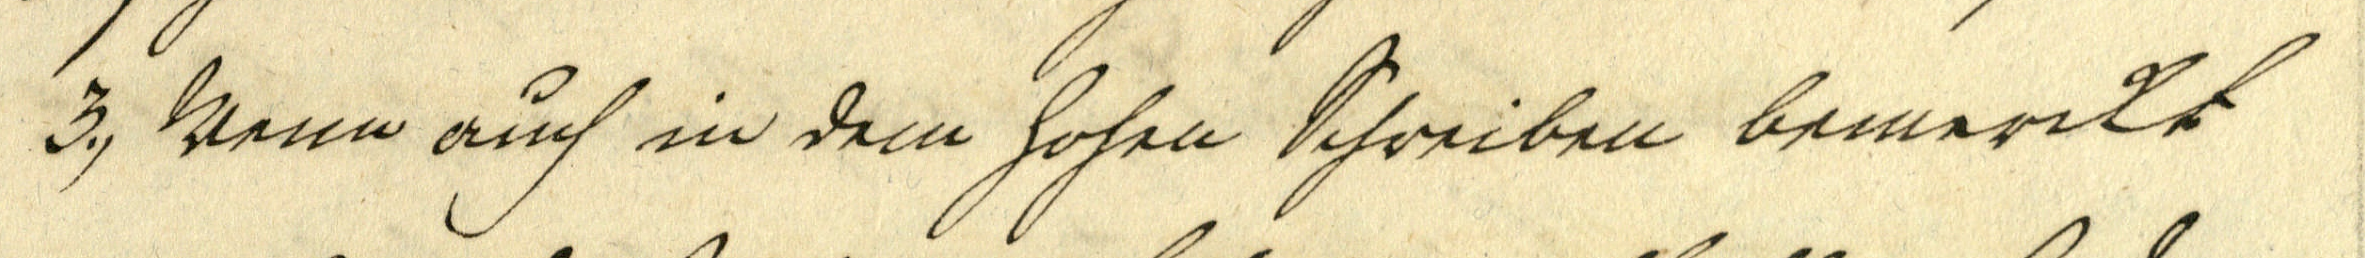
3, Wenn auch in dem hohen Schreiben bemerckt
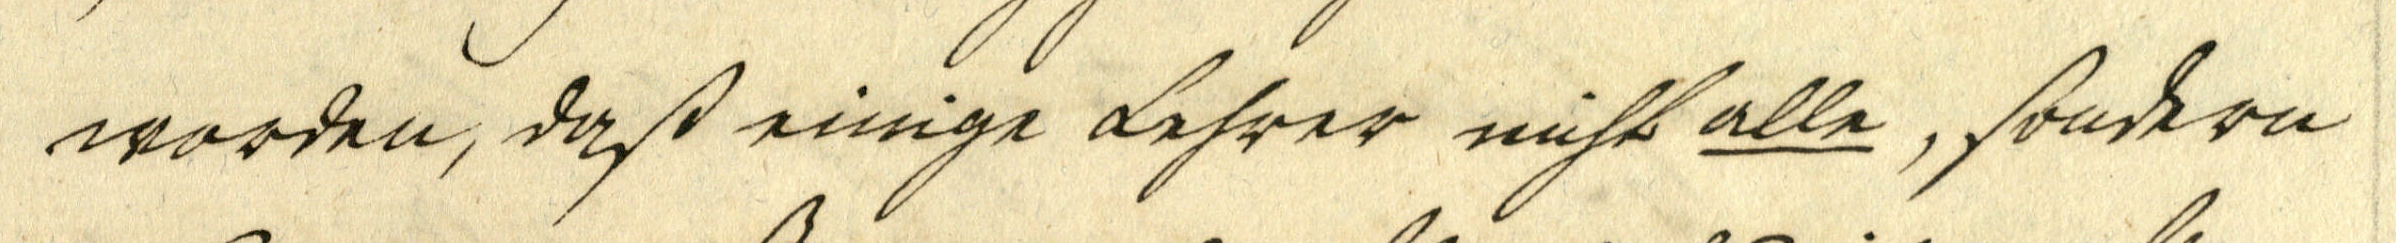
worden, daß einige Lehrer nicht alle, sondern
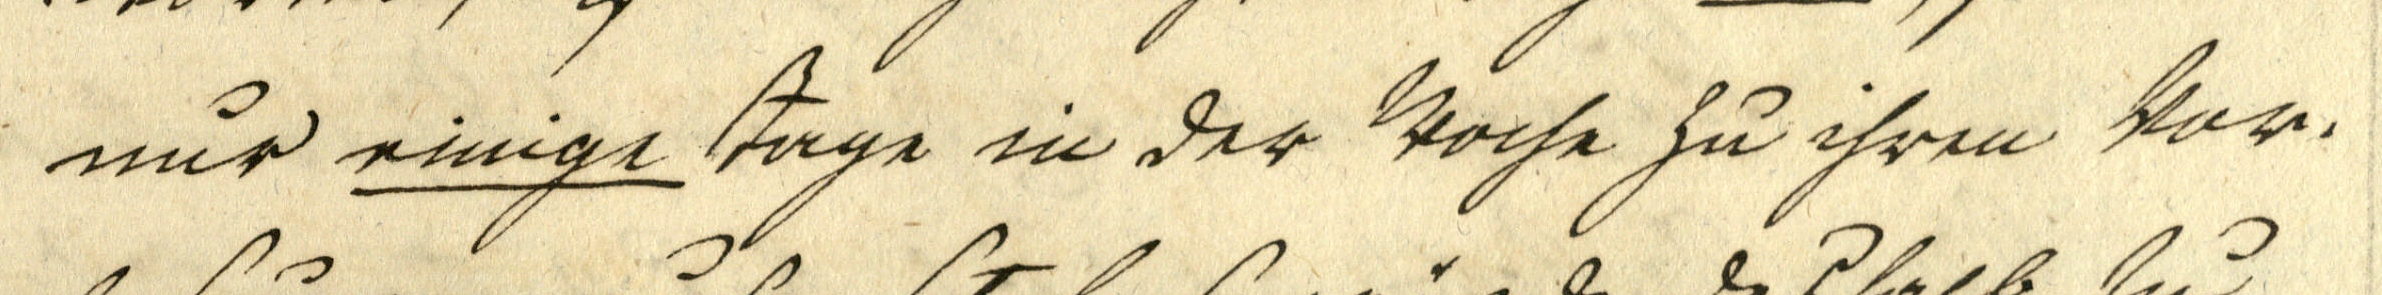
nur einige Tage in der Wache zu ihren Vor¬
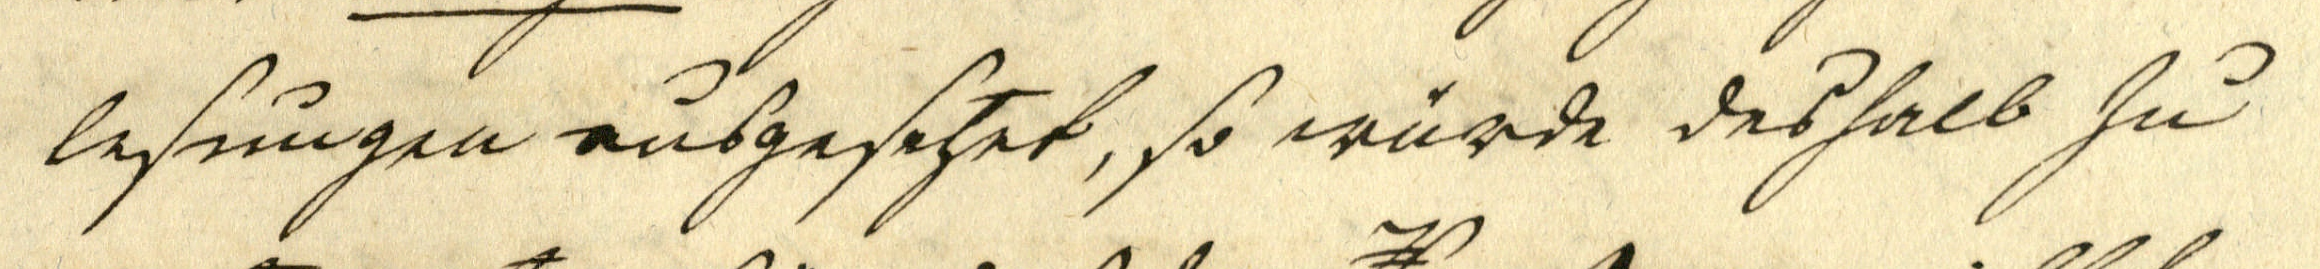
lesungen ausgesetzet, so würde deshalb zu
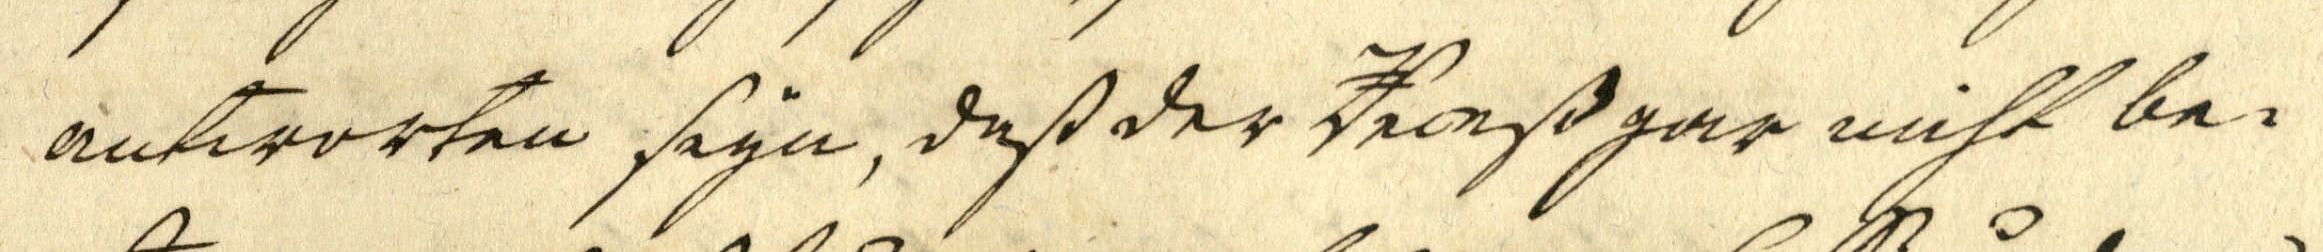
antworten seÿn, daß der Receß gar nicht be¬
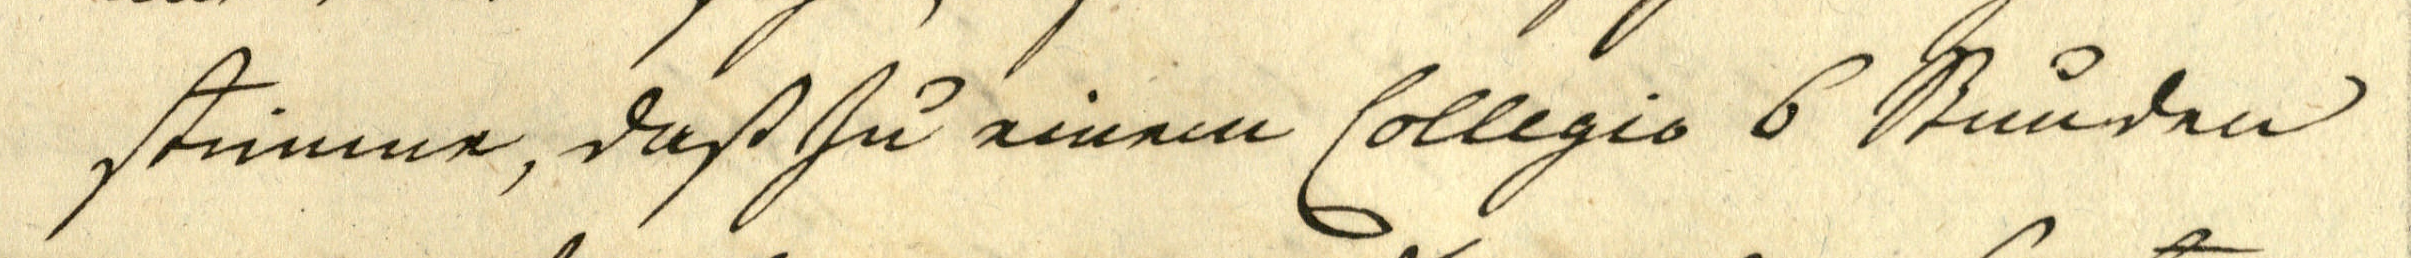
stimme, daß zu einem Collegio 6 Stunden
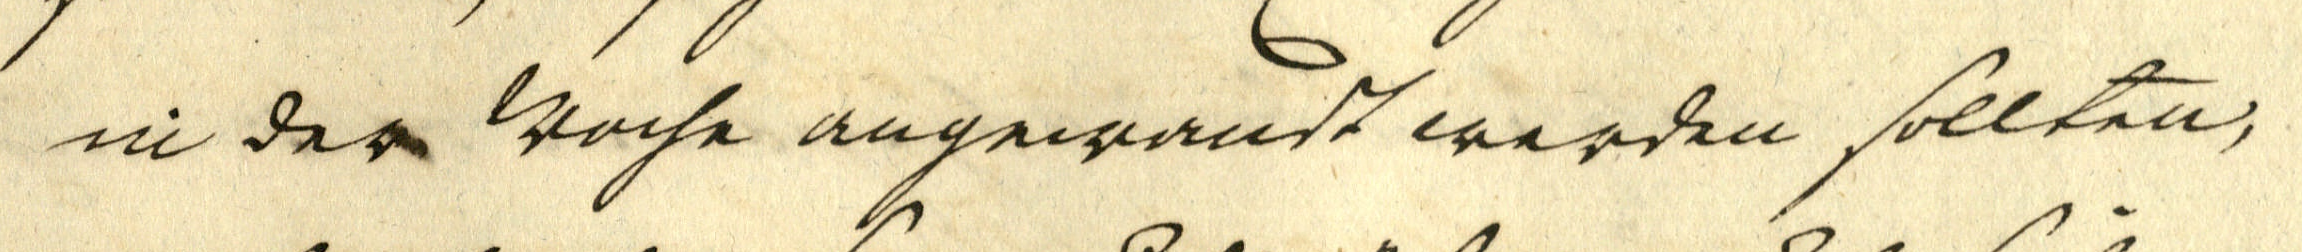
in der Woche angewandt werden sollten,
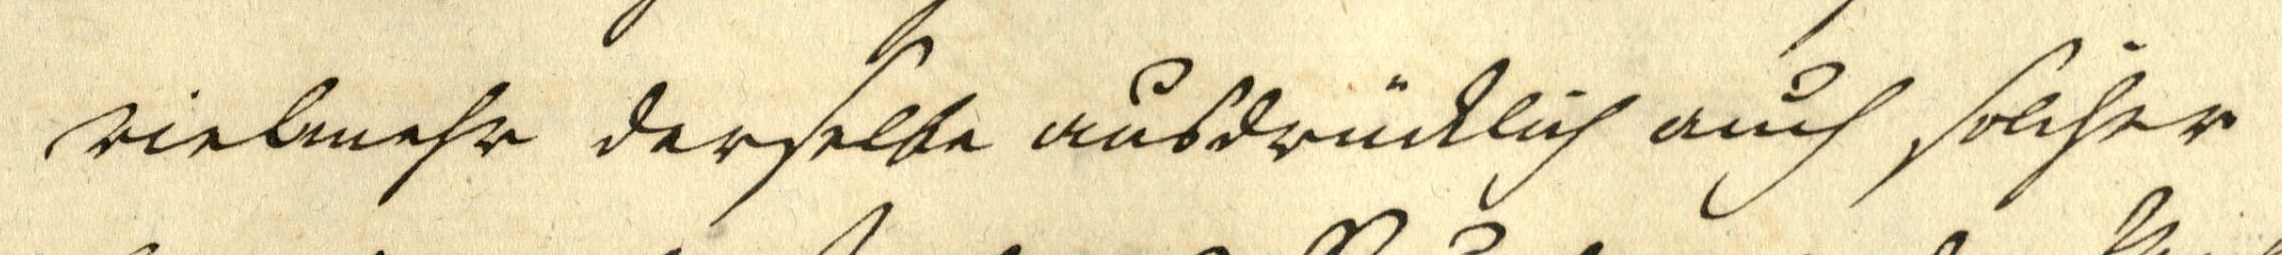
vielmehr derselbe ausdrücklich auch solcher
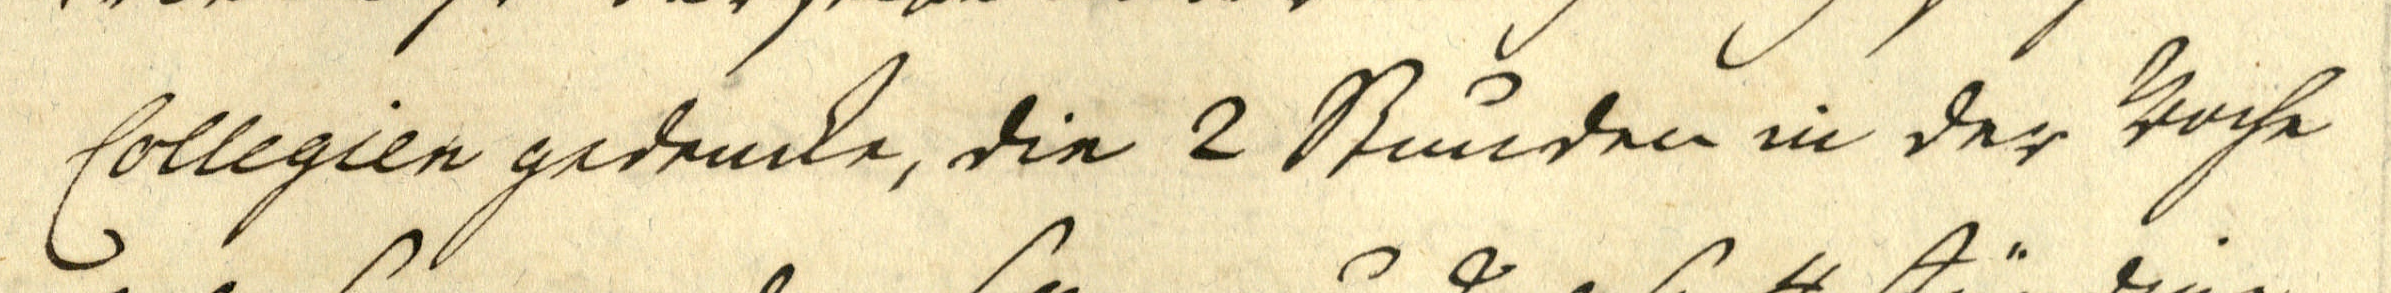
Collegien gedencke, die 2 Stunden in der Woche
